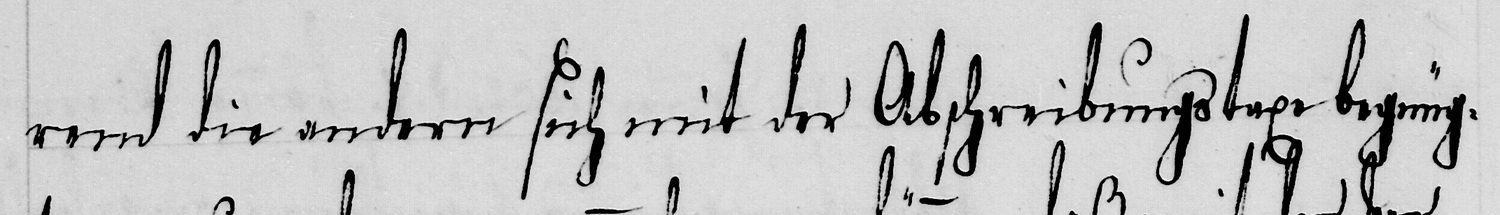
rend die andern sich mit der Abschreibungstaxe begn¬
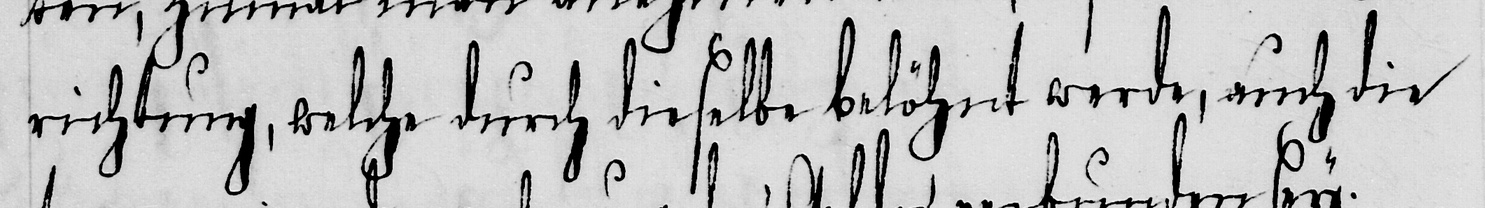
richtung, welche durch dieselbe belöhnt werde, auch die
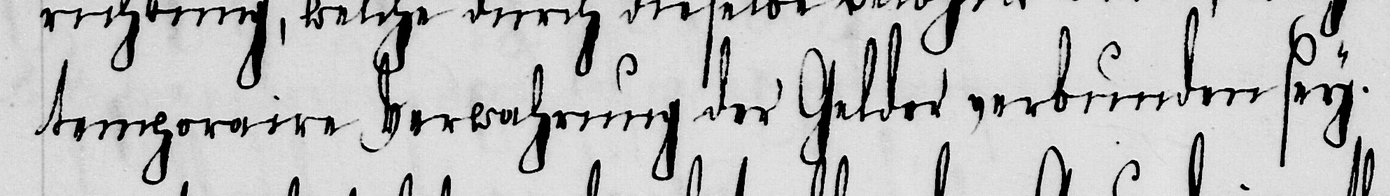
temporaire Verwahrung der Gelder verbunden sey.
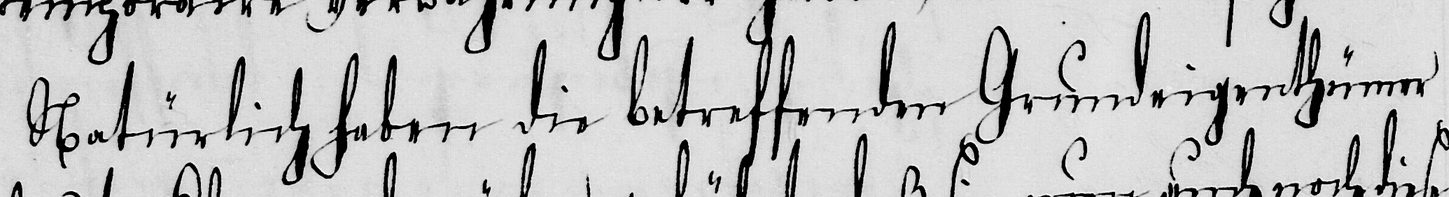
Natürlich haben die betreffenden Grundeigenthümer
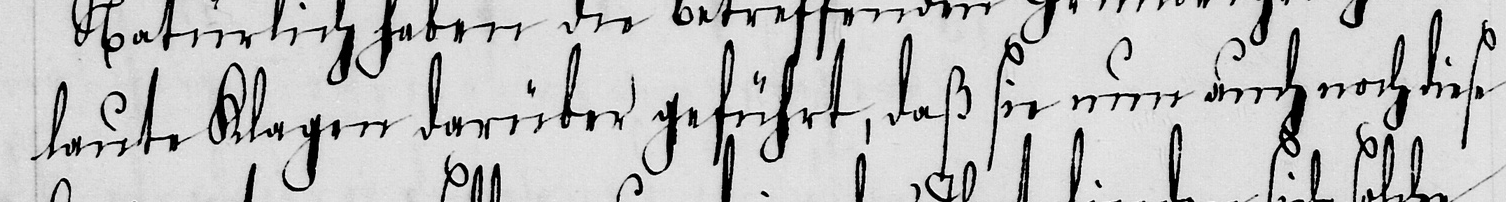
laute Klagen darüber geführt, daß sie nun auch noch die¬
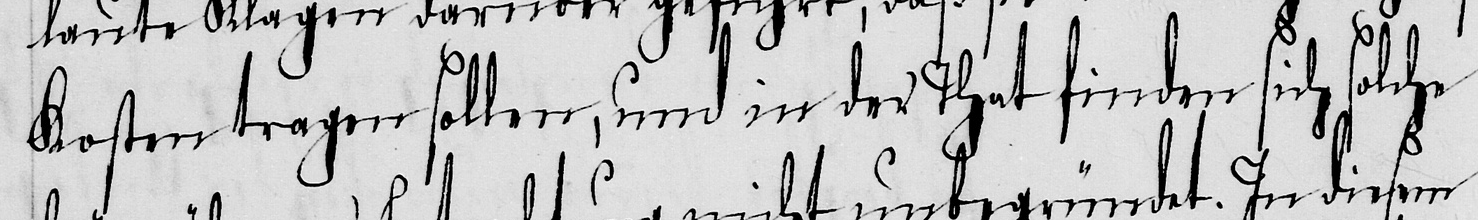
Kosten tragen sollen, und in der That finden sich solche
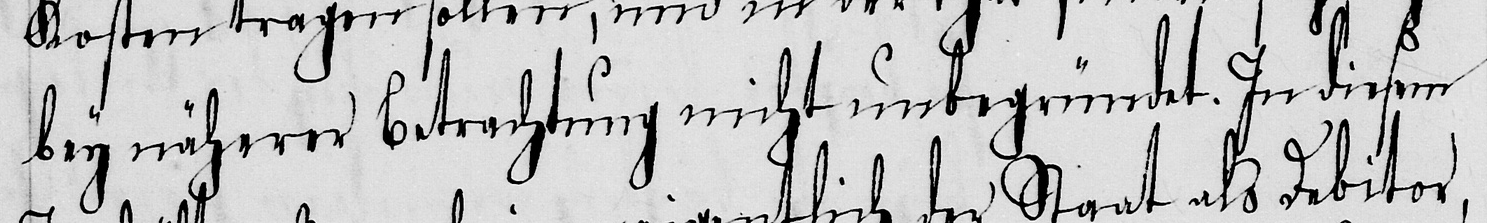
bey näherer Betrachtung nicht unbegründet. In diesem
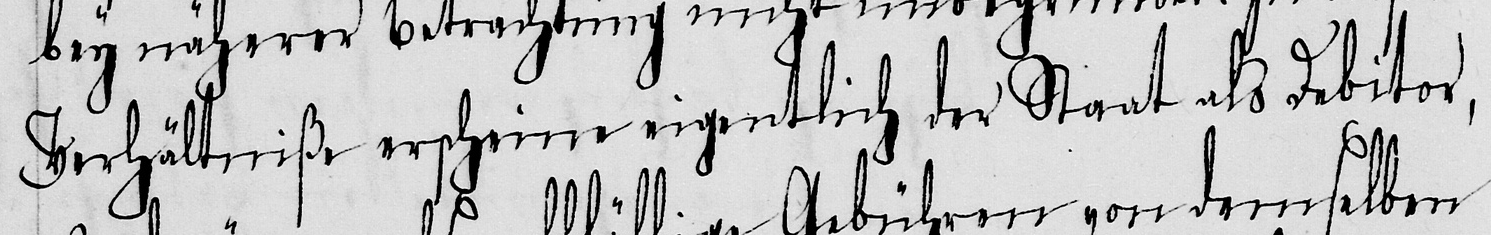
Verhältniße erscheine eigentlich der Staat als Debitor,
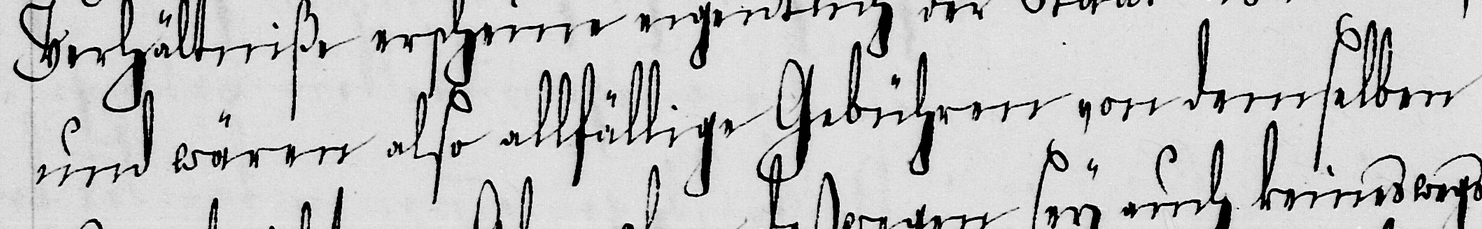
und wären also allfällige Gebühren von demselben
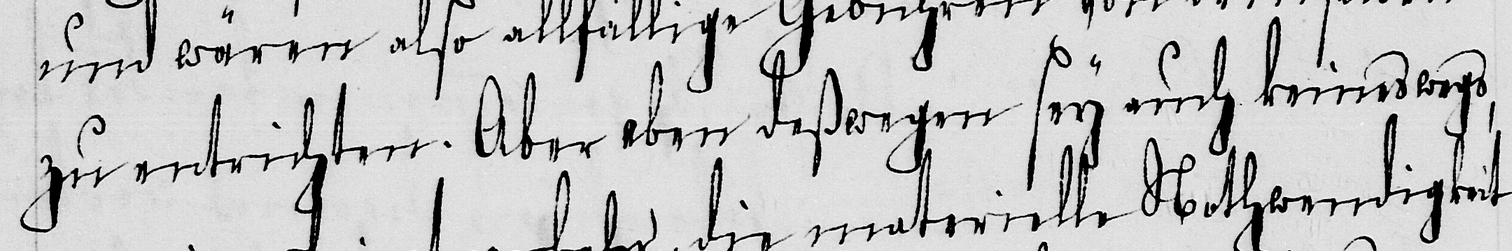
zu entrichten. Aber eben deßwegen sey auch keineswegs,
